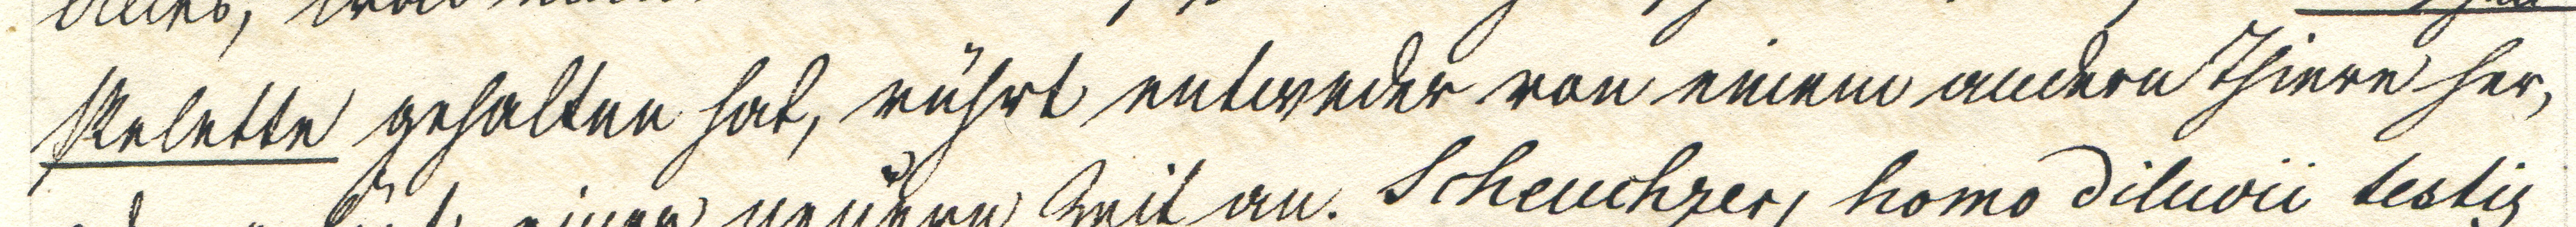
skelette gehalten hat, rührt entweder von einem andern Thiere her,
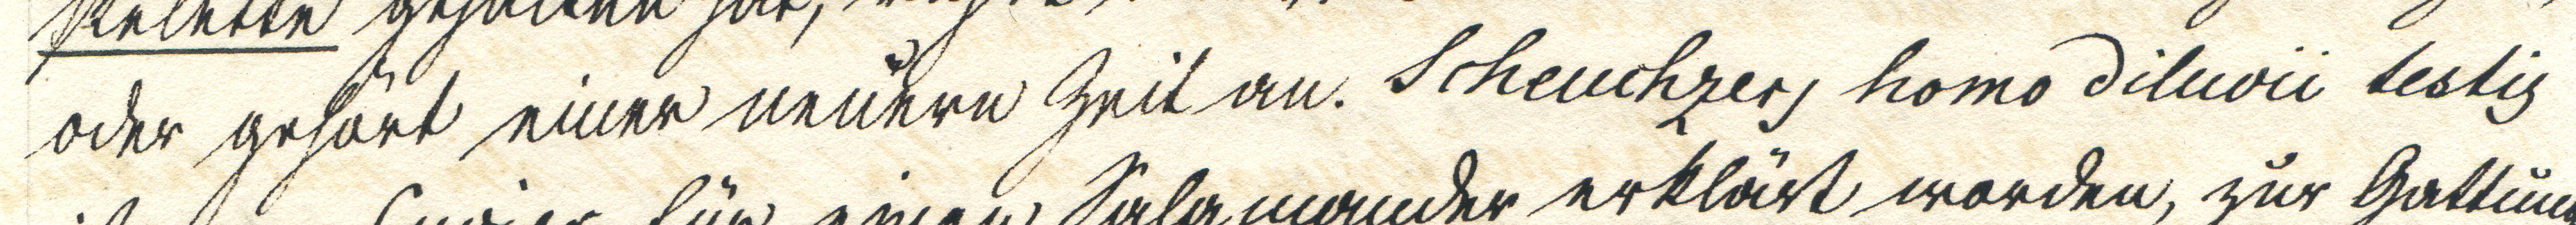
oder gehört einer neuern Zeit an. Scheuchzers homo diluvii testis
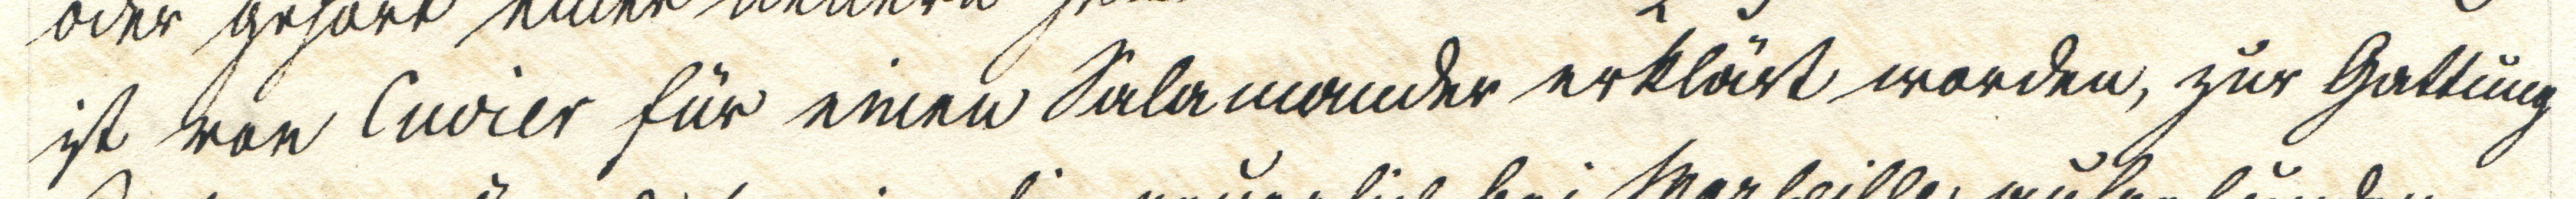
ist von Cuvier für einen Salamander erklärt worden, zur Gattung
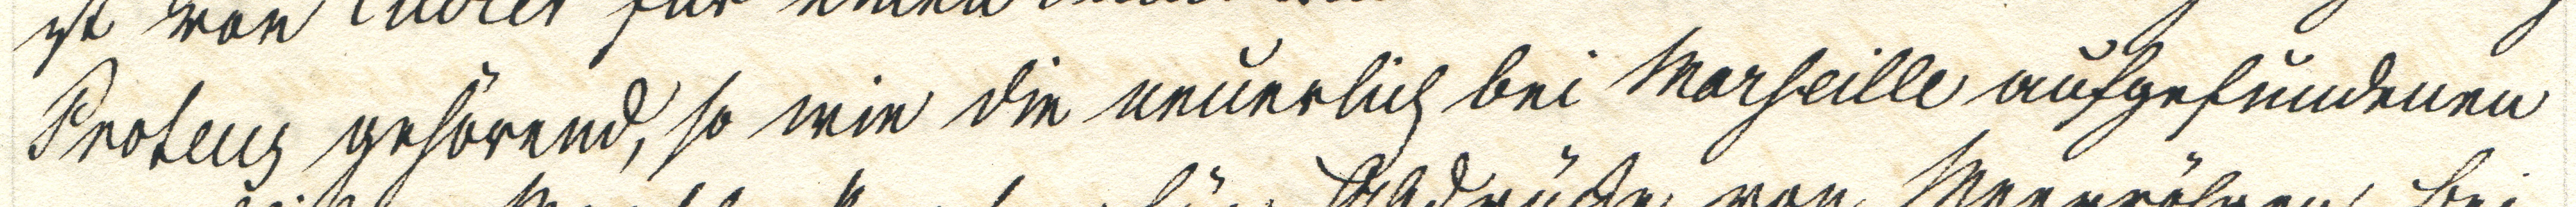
Proteus gehörend, so wie die neuerlich bei Marseille aufgefundenen
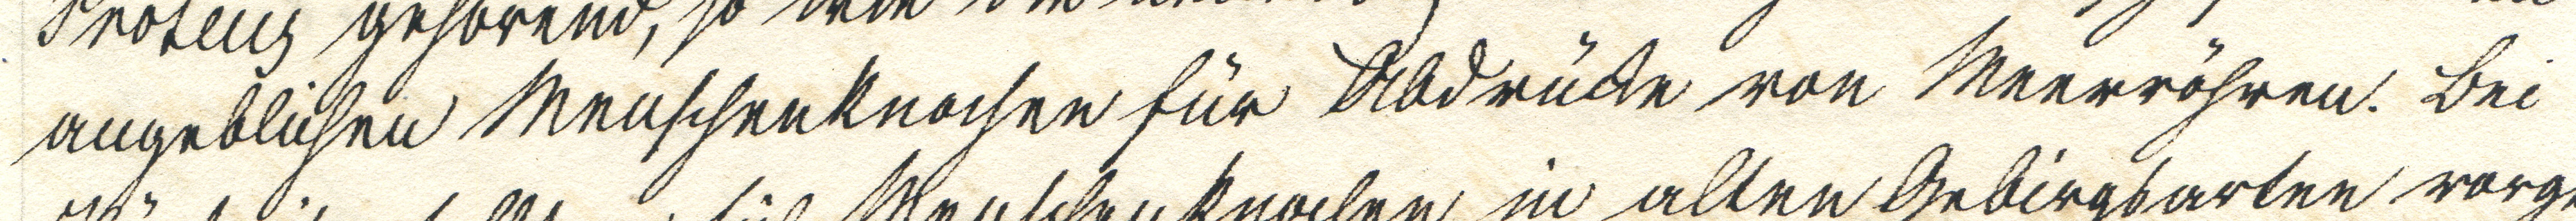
angeblichen Menschenknochen für Abdrücke von Meerröhren. Bei
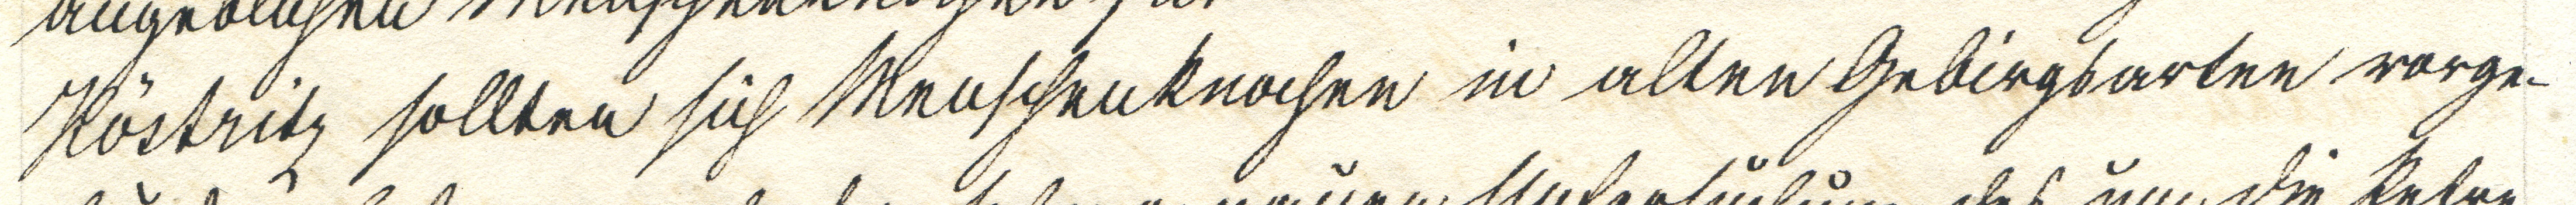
Köstritz sollten sich Menschenknochen in alten Gebirgsarten vorge-
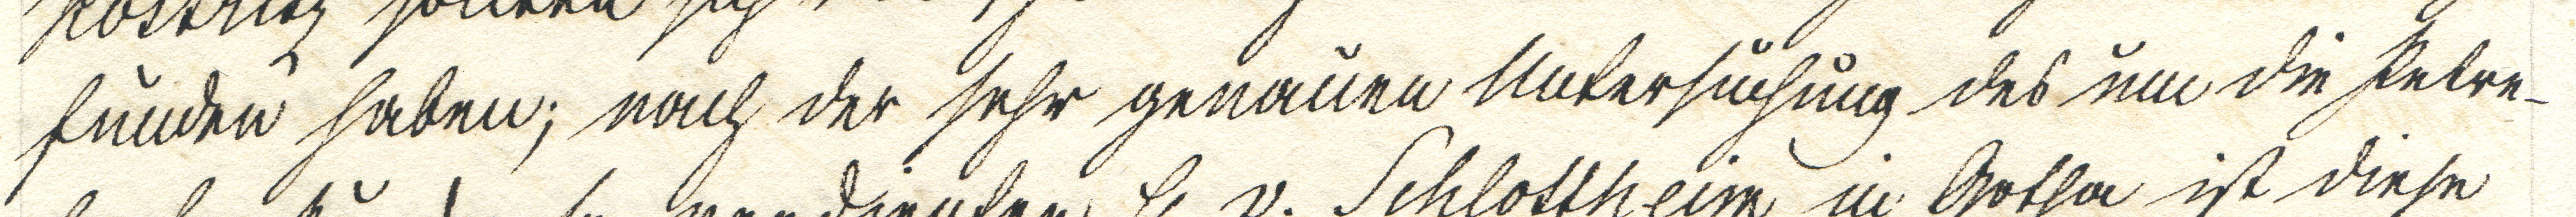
funden haben; nach der sehr genauen Untersuchung des um die Petre-
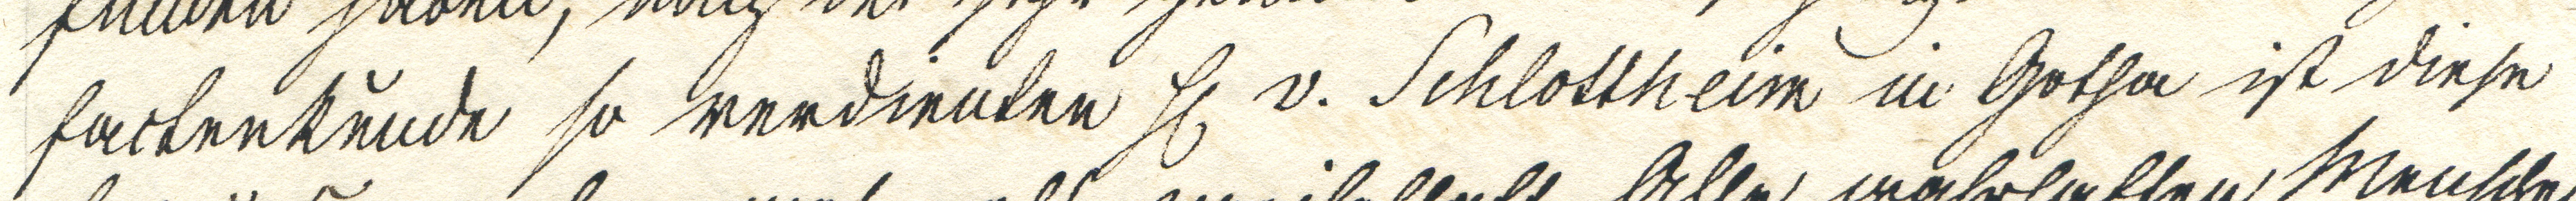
factenkunde so verdienten H￼ v. Schlottheim in Gotha ist diese
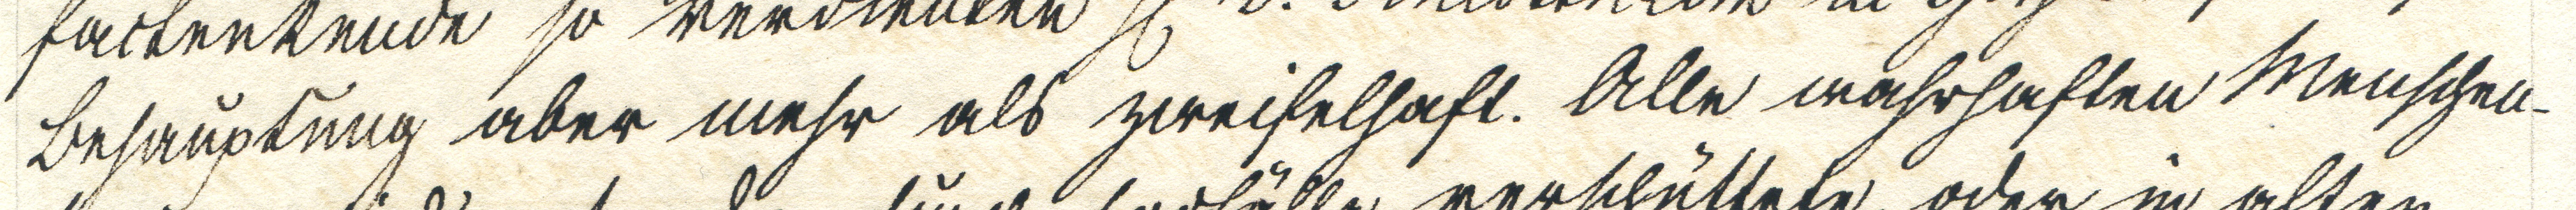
Behauptung aber mehr als zweifelhaft. Alle wahrhaften Menschen-
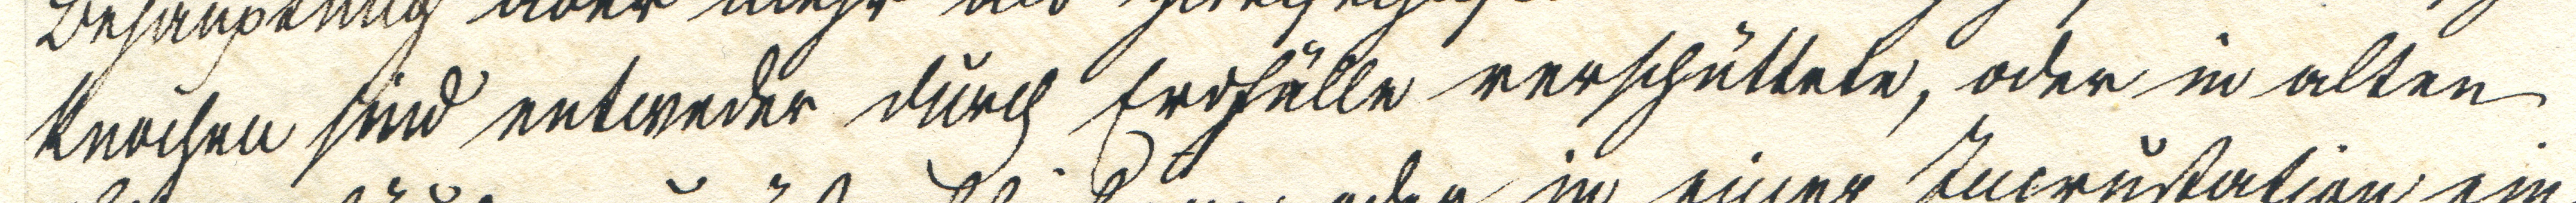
knochen sind entweder durch Erdfälle verschüttete, oder in alten
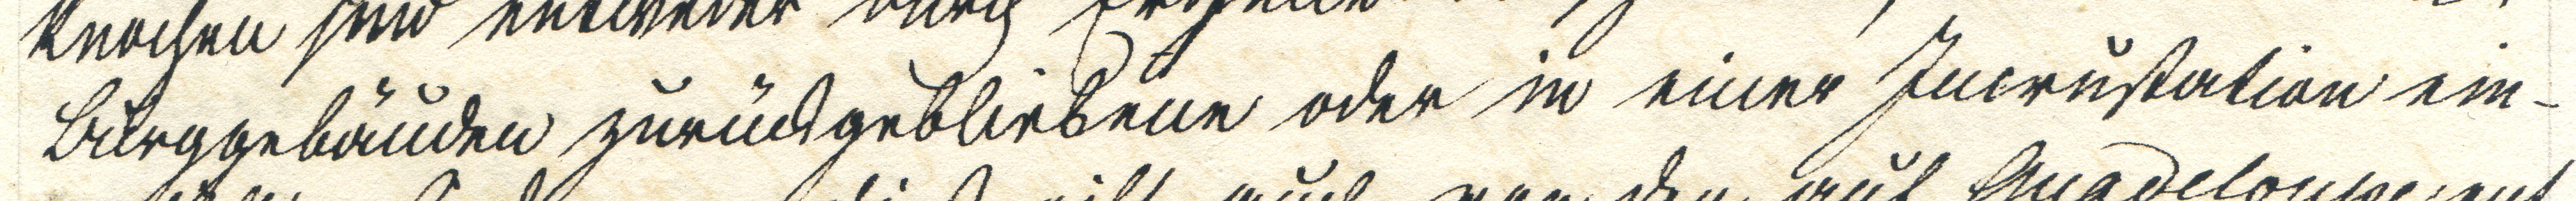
Burggebäuden zurückgebliebene oder in einer Incrustation ein-
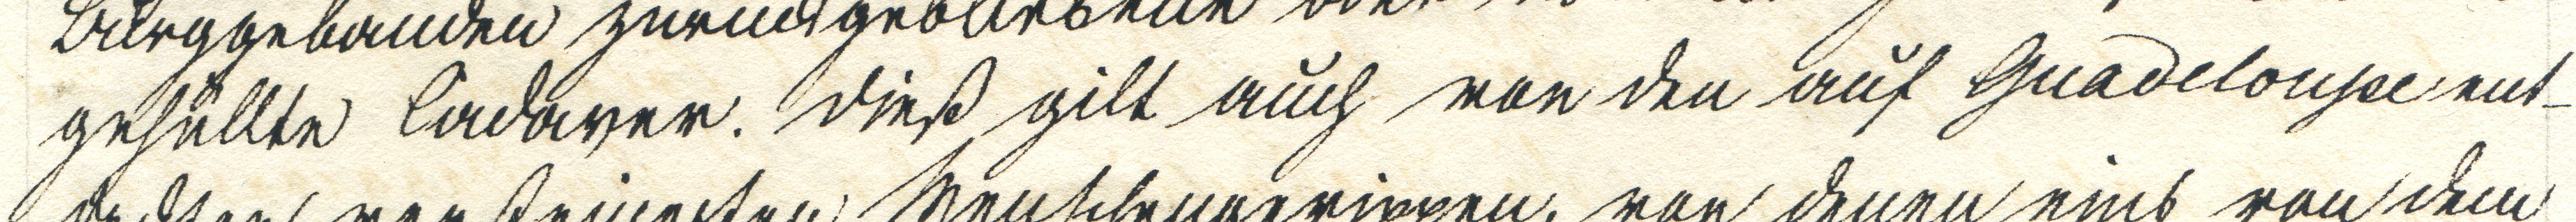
gehüllte Cadaver. Dieß gilt auch von den auf Guadeloupe ent-
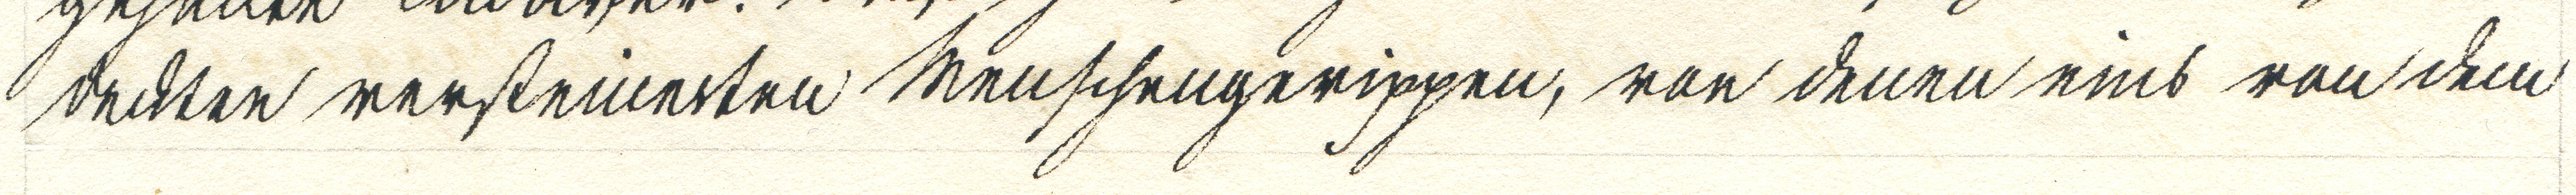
deckten versteinerten Menschengerippen, von denen eins von dem
